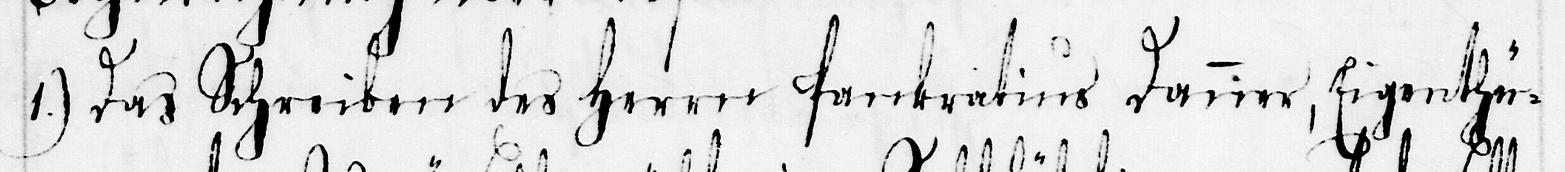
1.) Das Schreiben des Herrn Pankratius Danner, Eigenthü¬
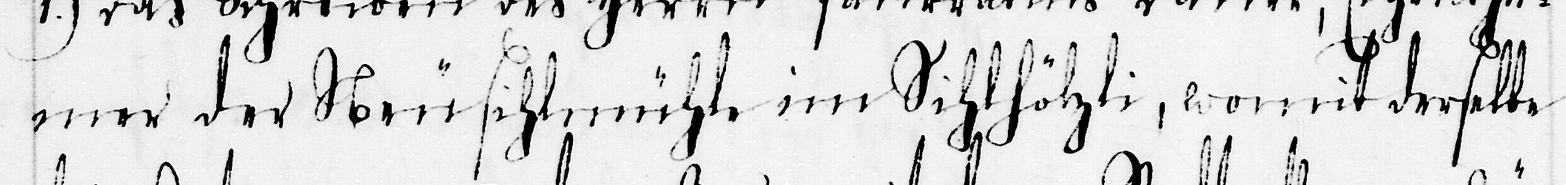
mer der Neusihlmühle im Sihlhölzli, womit derselbe
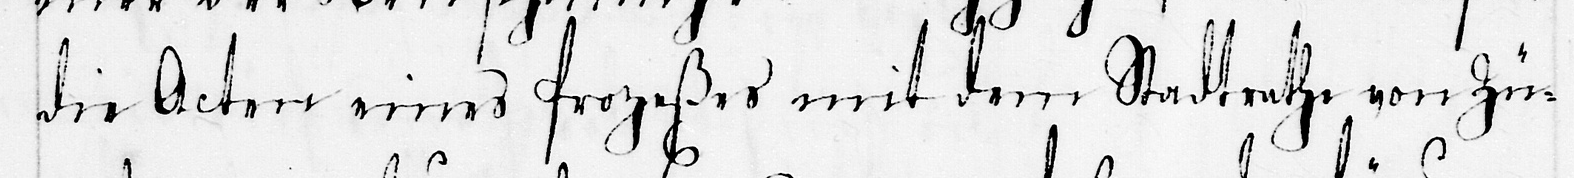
die Acten eines Prozeßes mit dem Stadtrathe von Zü¬
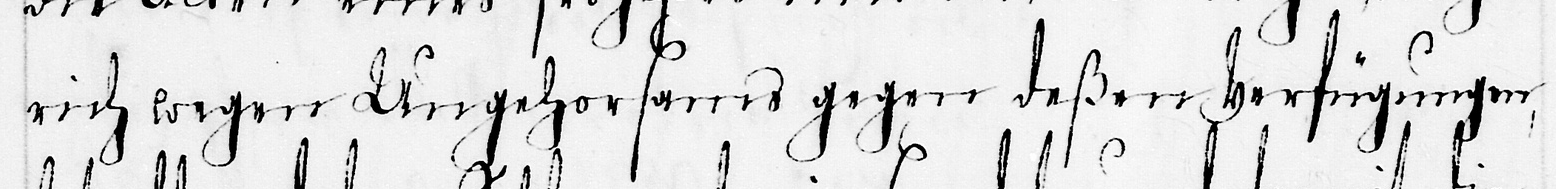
rich wegen Ungehorsams gegen deßen Verfügungen,
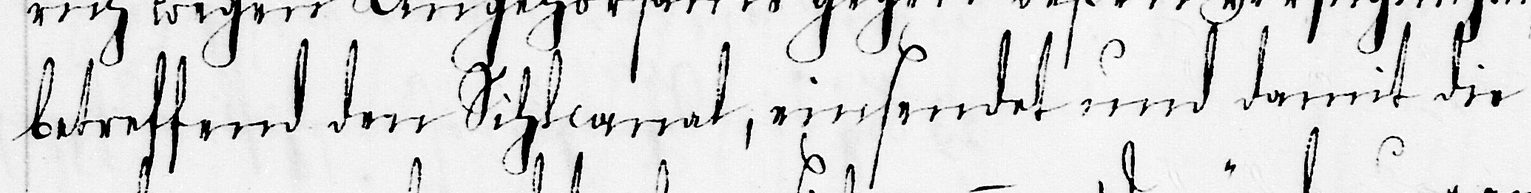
betreffend den Sihlcanal, einsendet und damit die
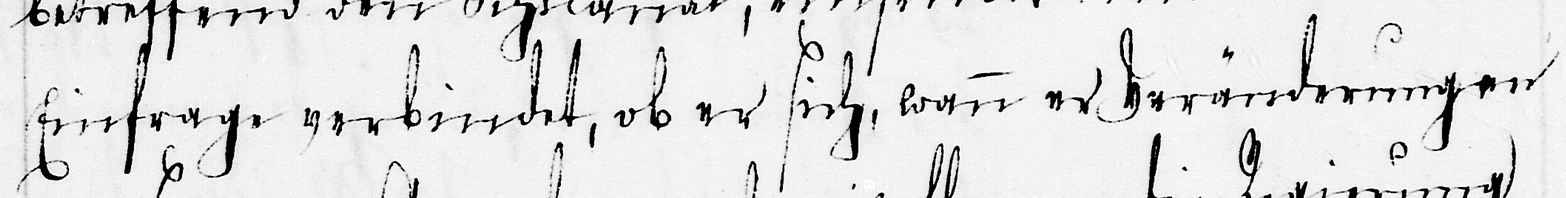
Einfrage verbindet, ob er sich, wann er Veränderungen
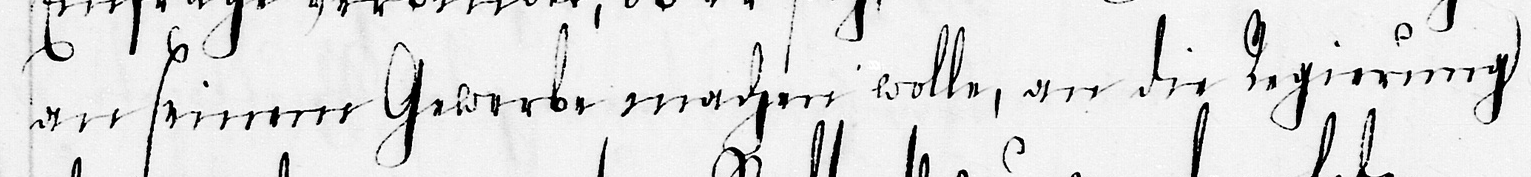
an seinem Gewerbe machen wolle, an die Regierung
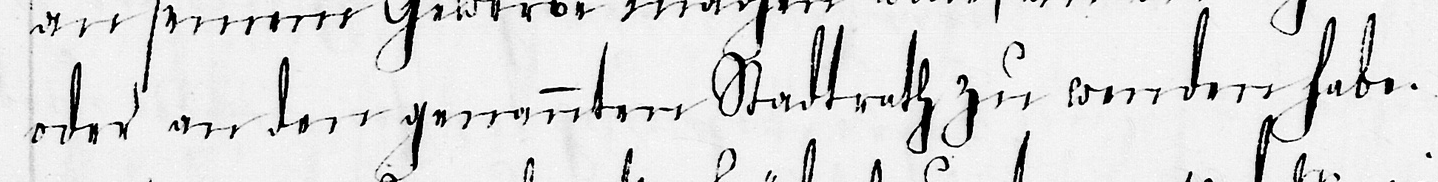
oder an den genannten Stadtrath zu wenden habe.
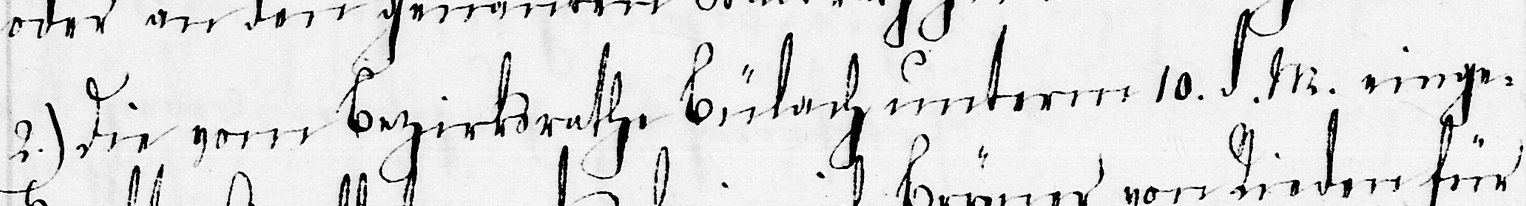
2.) Die vom Bezirksrathe Bülach unterm 10. d. M. einge¬
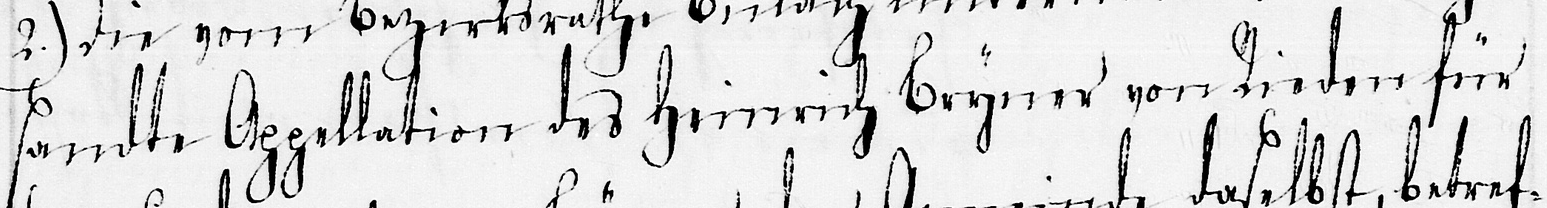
sandte Appellation des Heinrich Beyner von Rieden für
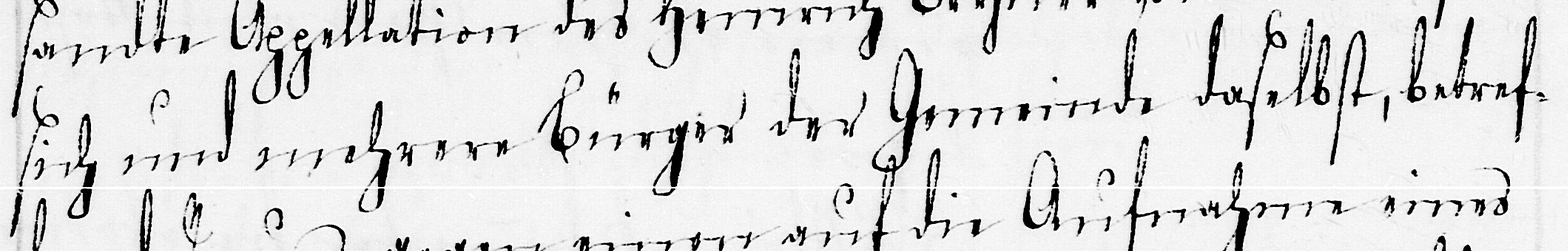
sich und mehrere Bürger der Gemeinde daselbst, betref¬
